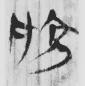{爿兔}
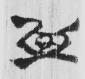𠀠
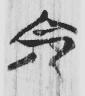命
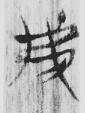弗
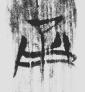甬
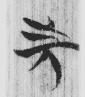先
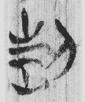{屮二屮刀}
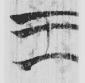王
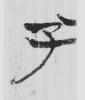孔
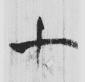甲
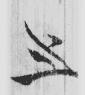之
